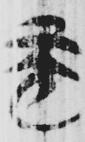而
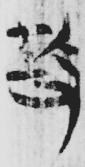攻
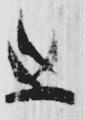之
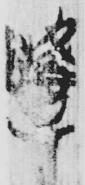○（降）
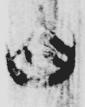自
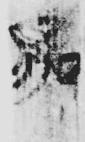鳴
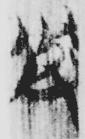攸（條）
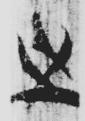之
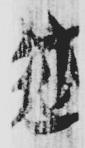述（遂）
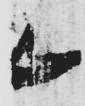㠯（以）
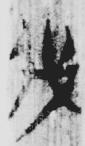伐
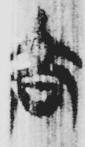高
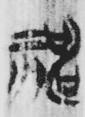神
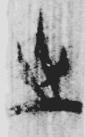之
